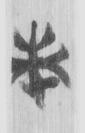未
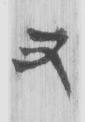又
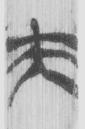夫
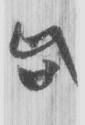句
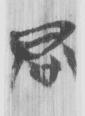君
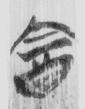富
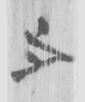之
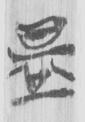昷
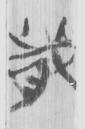歲
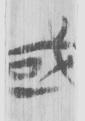或
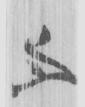之
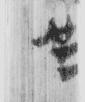{廿二}
